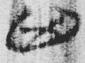凶
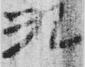九
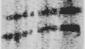二
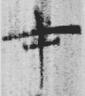才（在）
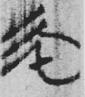帀（師）
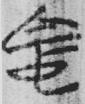○（中）
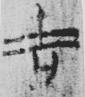吉
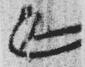亡（无）
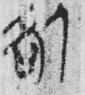咎
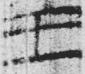王
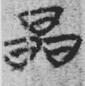晶（三）
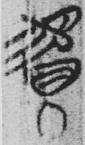賜
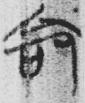命
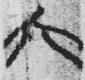六
